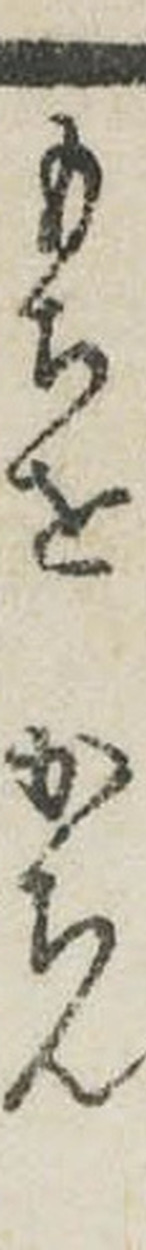もちをかちん
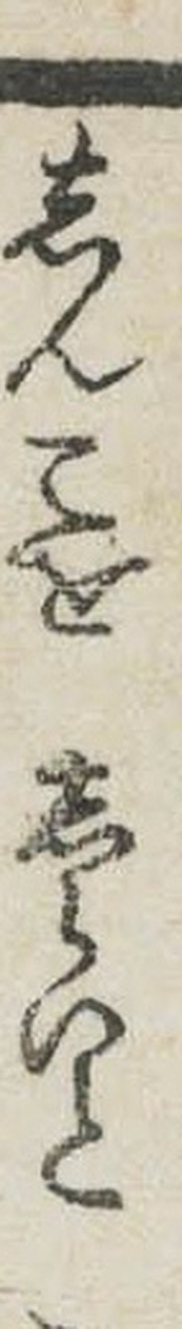しんこをしらいと
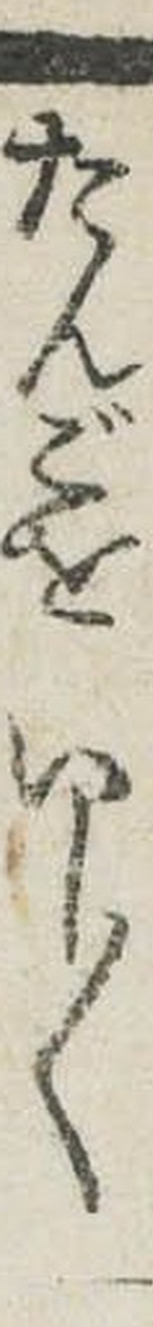たんごをいし〳〵
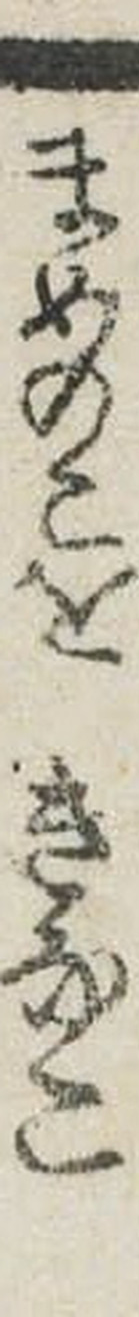まめのこをきなこ
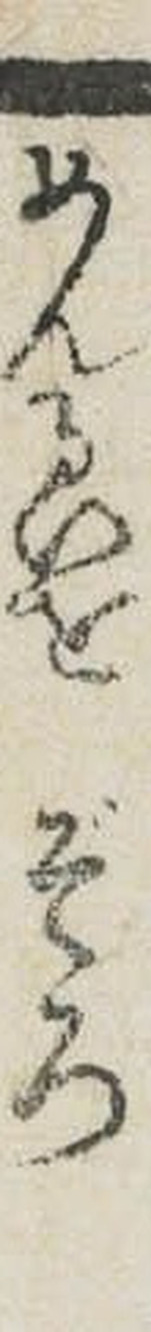めんるいをぞろ
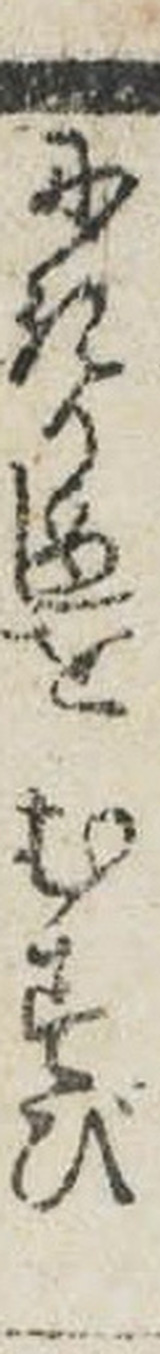にきりめしをむすび
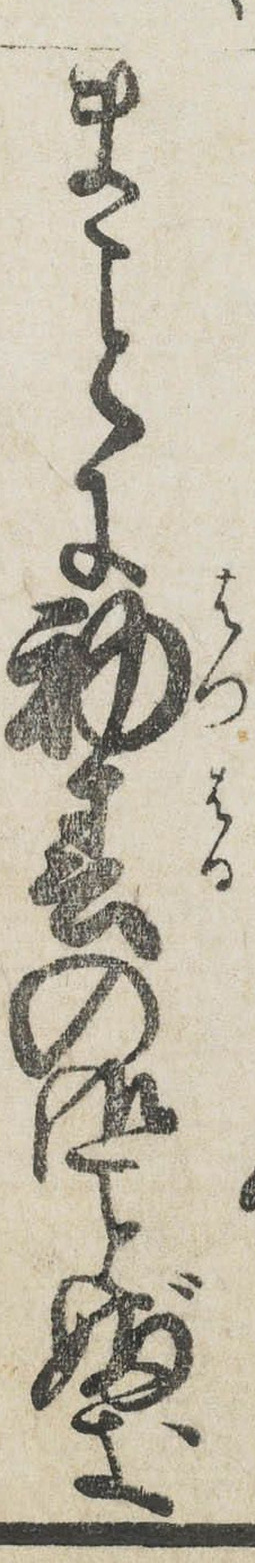まことに初春の御ことぶき
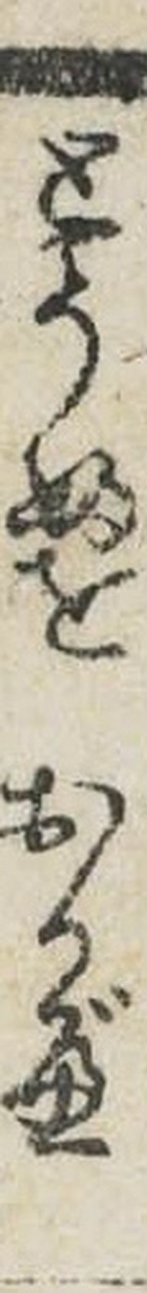とうふをおかべ
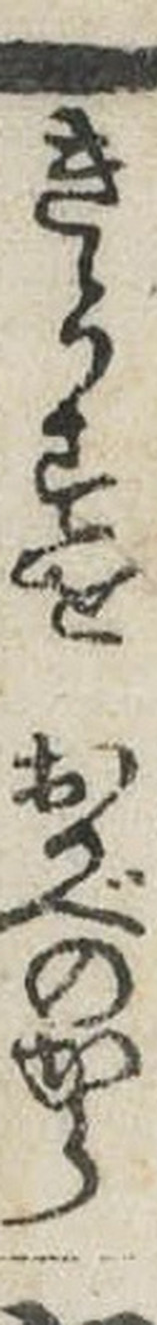きらすをおかべのから
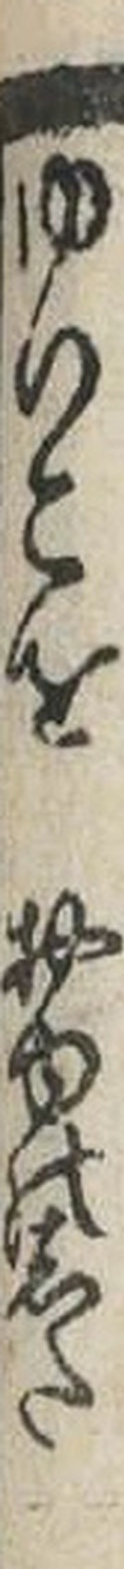ゆいこをおゆのした
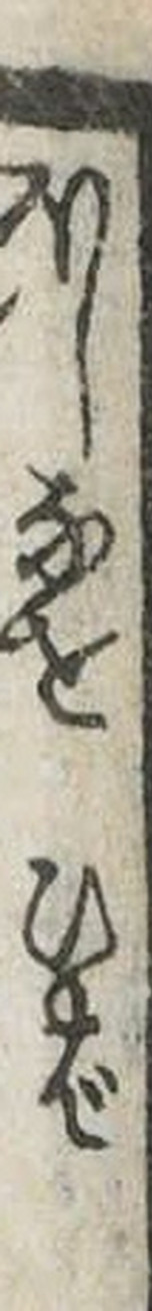ほしなをひば
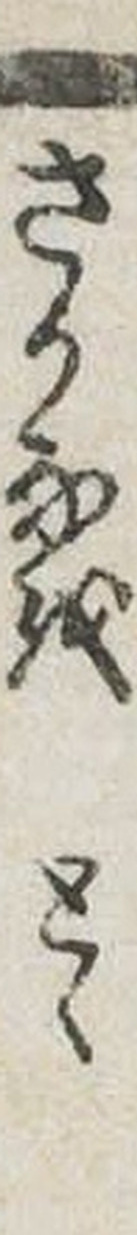さかなをとゝ
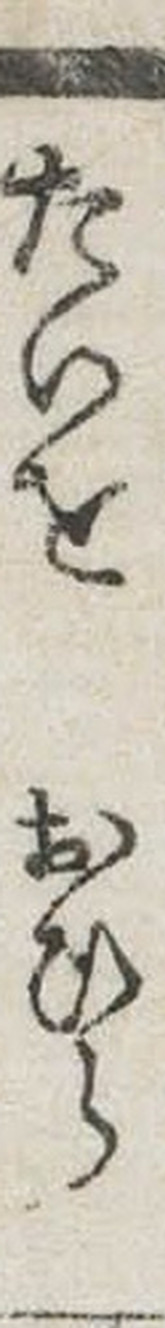たいをおひら
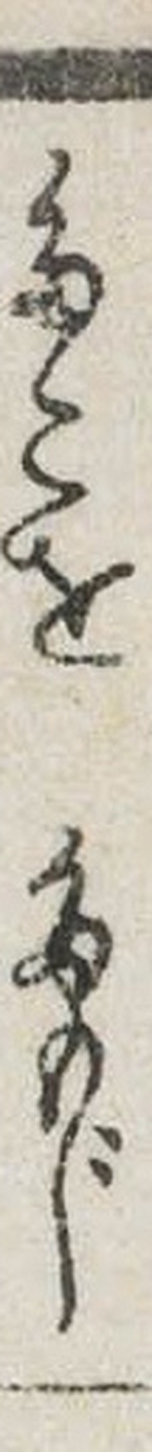たこをたもじ
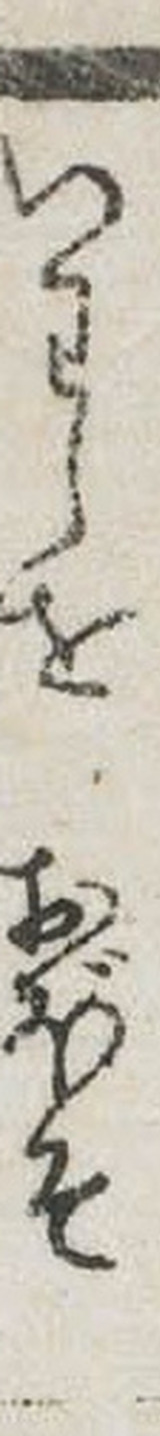いわしをおぼそ
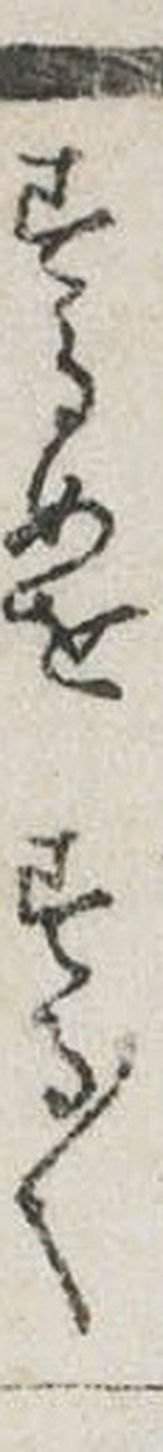するめをする〳〵
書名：頭書萬用婦人手紙之文言
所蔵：東京学芸大学教育コンテンツアーカイブ
